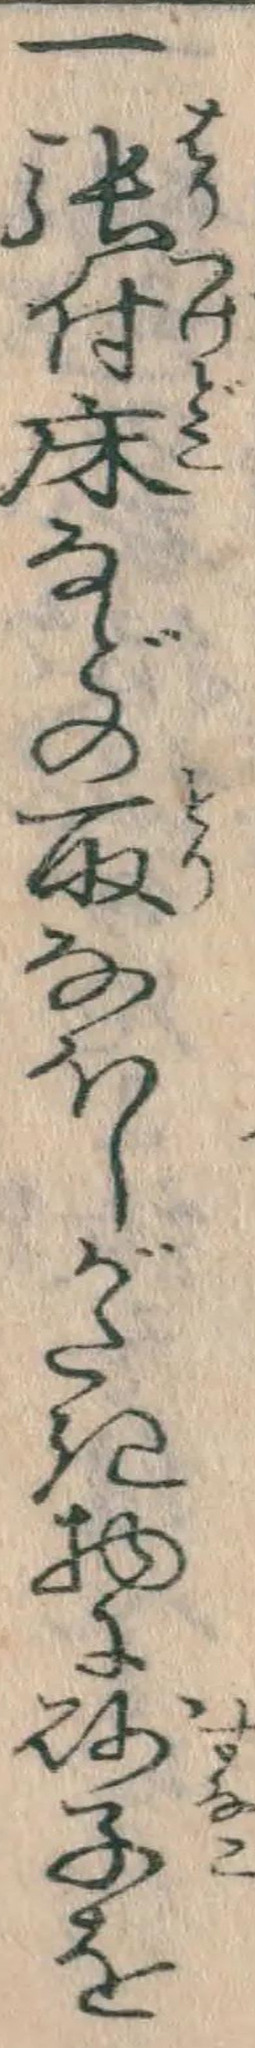一張付床などの取なほしがたき物に砂子を
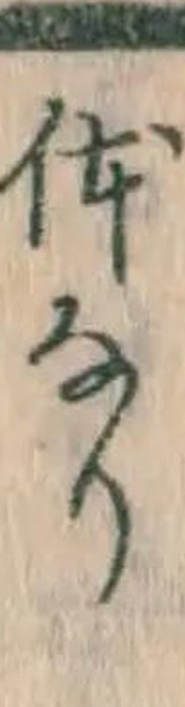体なり
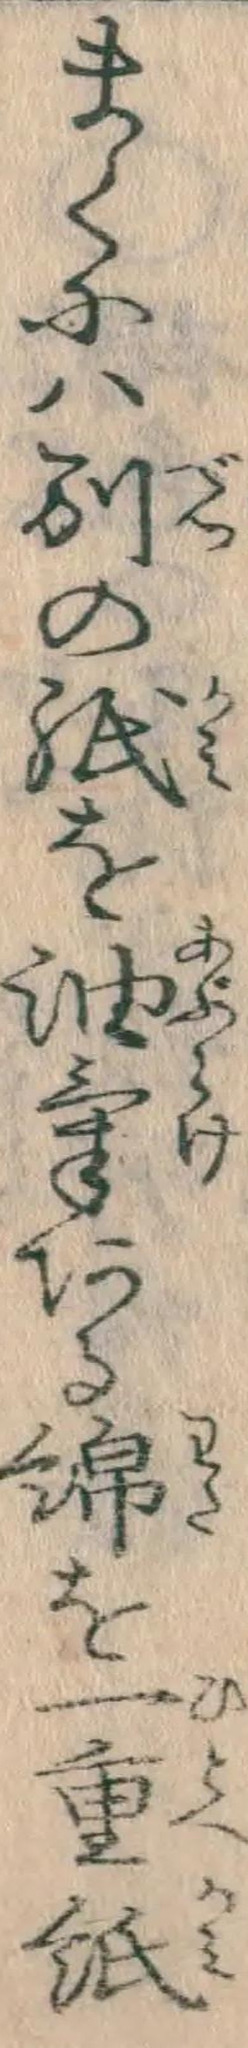まくには別の紙を油気ある綿を一重紙
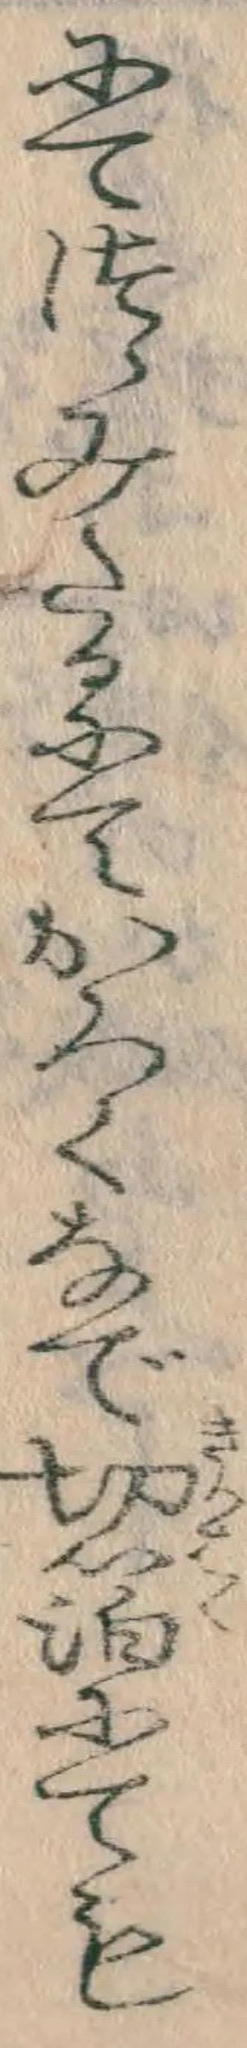にてつゝみたるにてかろくなで切箔にても
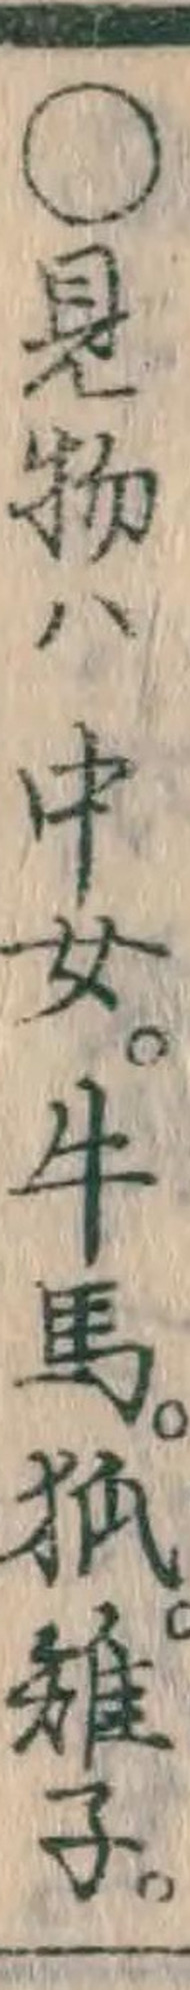○見物は中女。牛馬。狐。雉子。
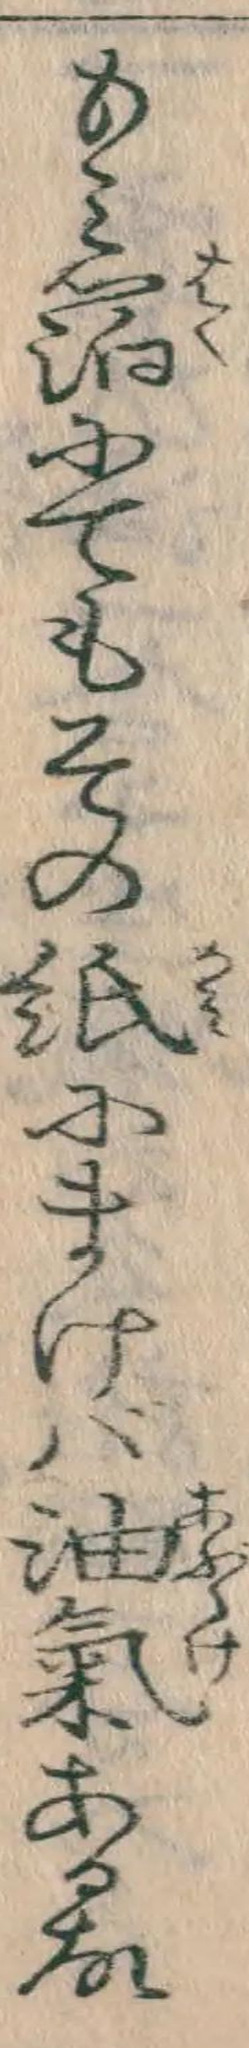もみ箔にてもその紙にまけば油気ある故
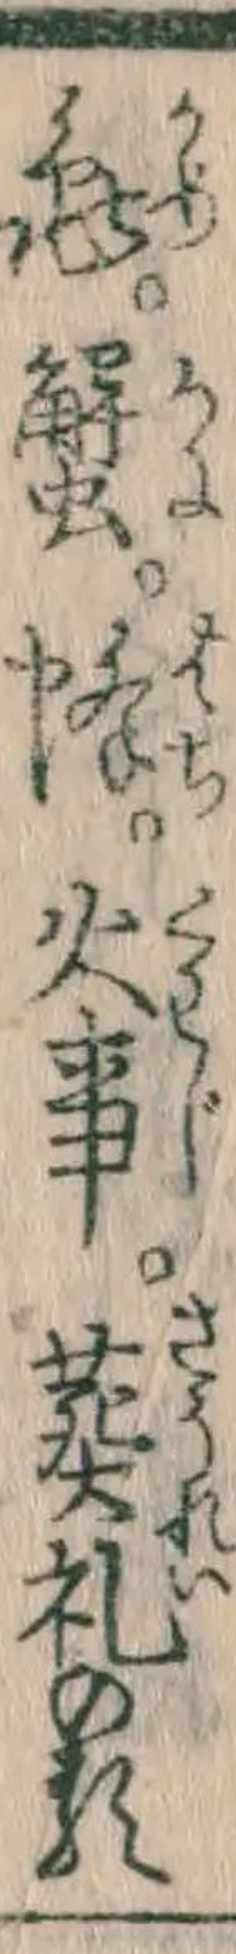亀。蟹。蜂。火事。葬礼の類
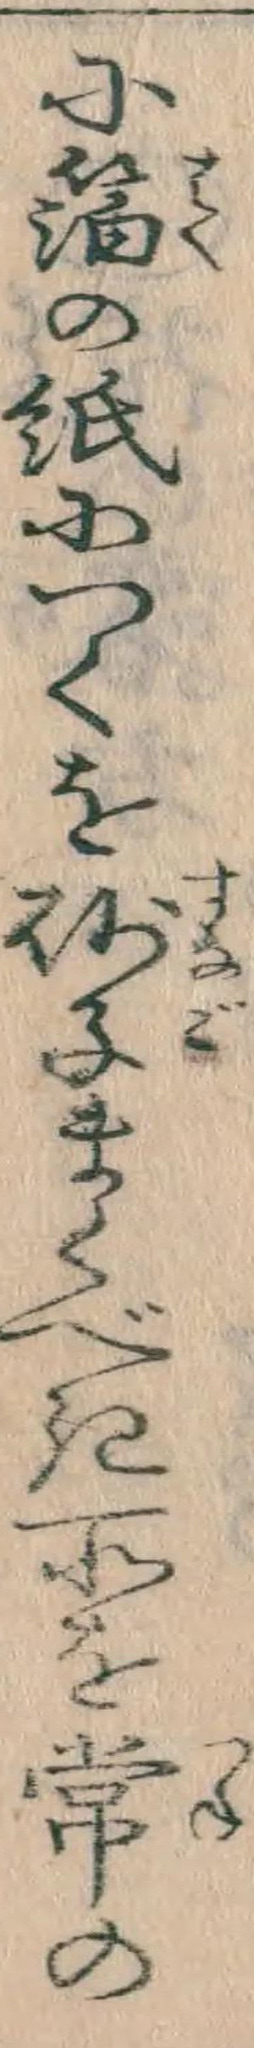に箔の紙につくを砂子まくべき所を常の
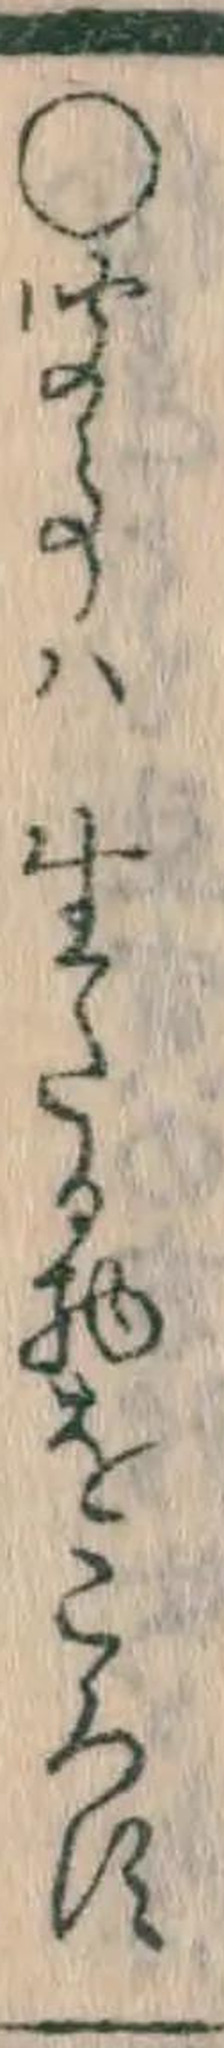○聞事は生きたる物をころす
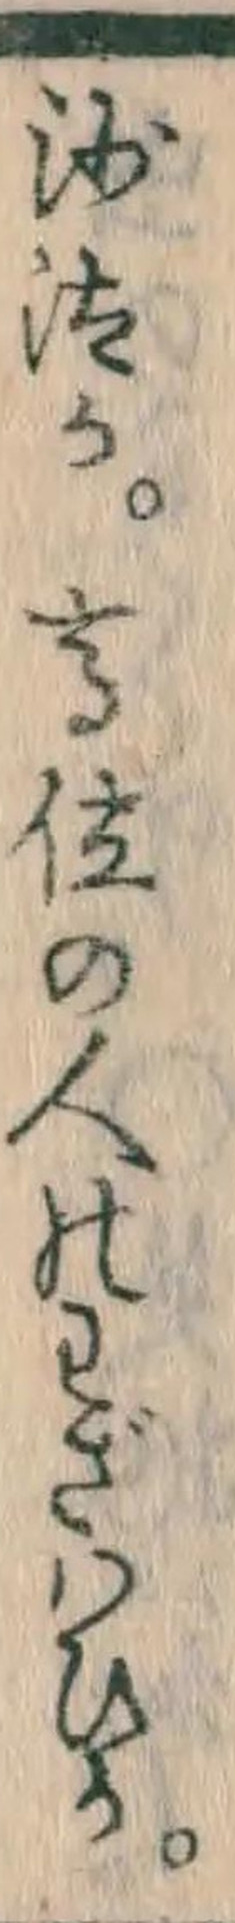沙汰か。高位の人のわざはひか。
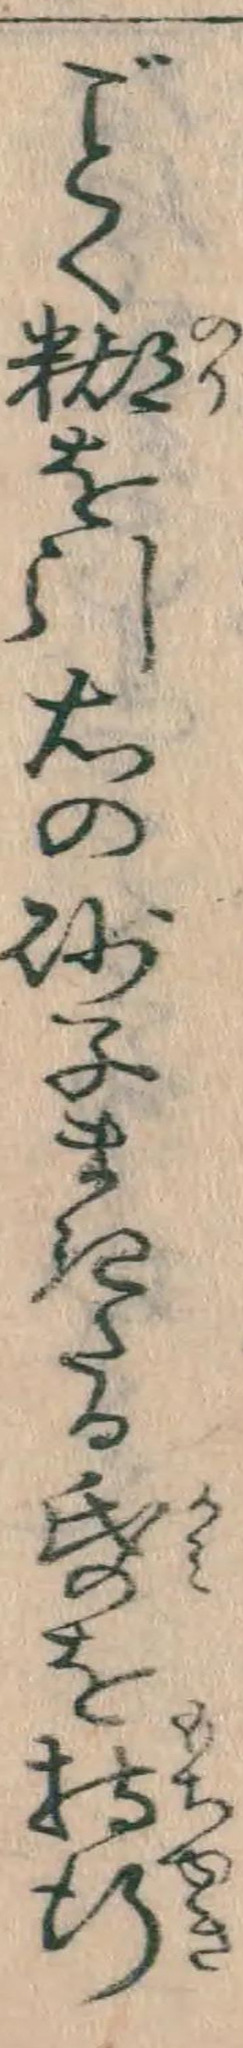ごとく糊を引右の砂子まきたる紙を持行
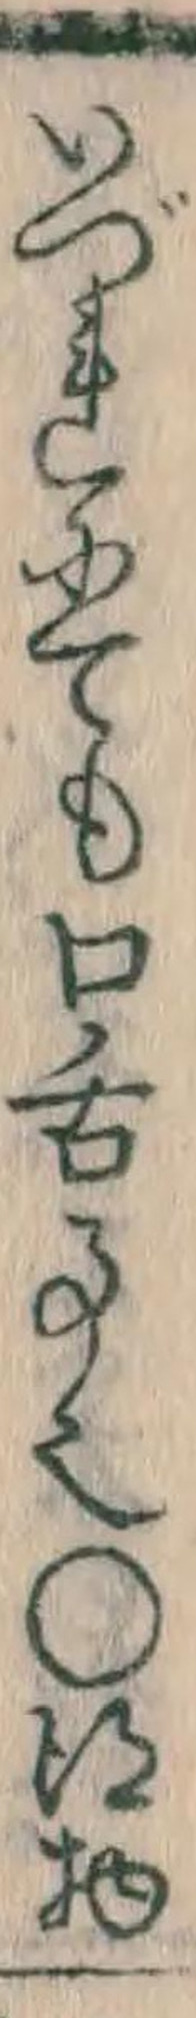いづれにても口舌事也。○得物
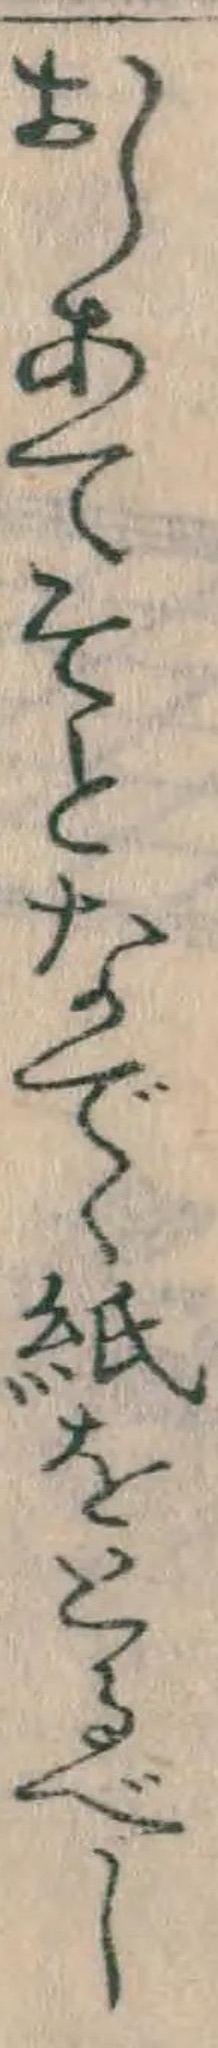おしあてそとなでゝ紙をとるべし
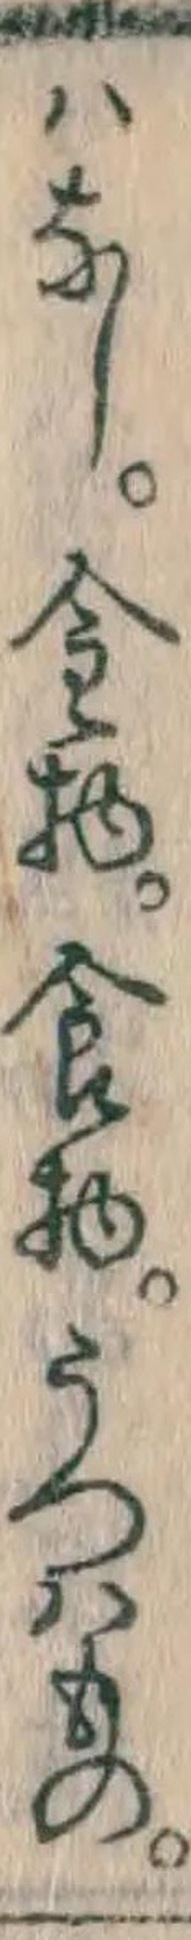はなし。金物。食物。うつはもの。
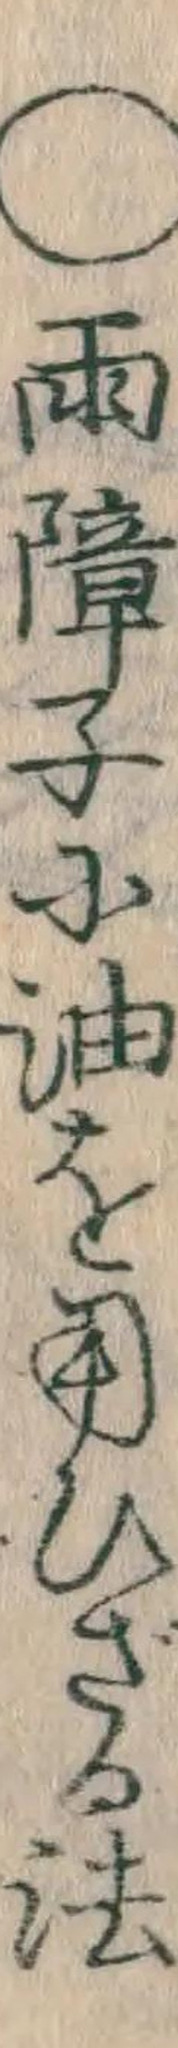○雨障子に油を用ひざる法
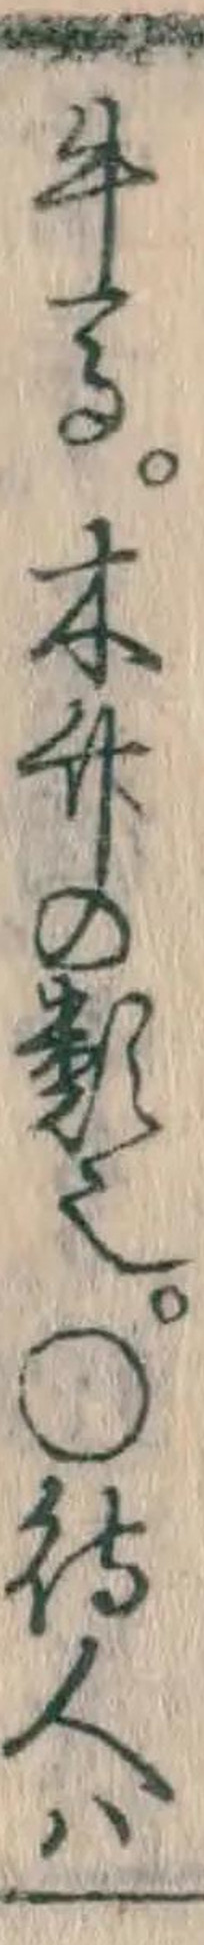牛馬。木竹の類也。○待人は
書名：広益秘事大全 3巻. [1]
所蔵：国立国会図書館 National Diet Library, JAPAN
